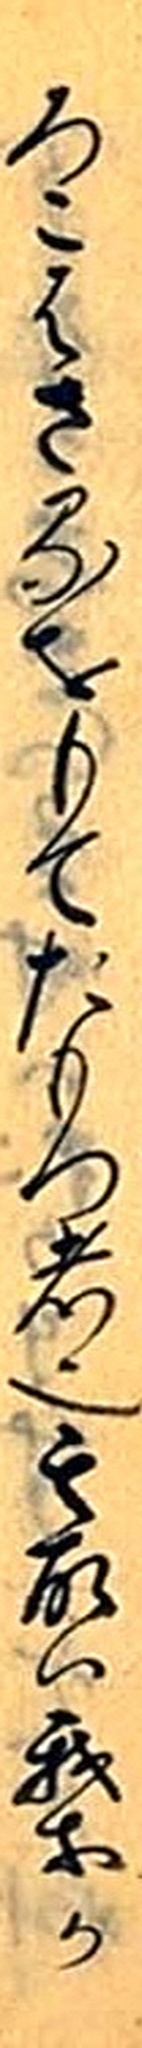ろこはさるをもてたもつ者也其故は我等か
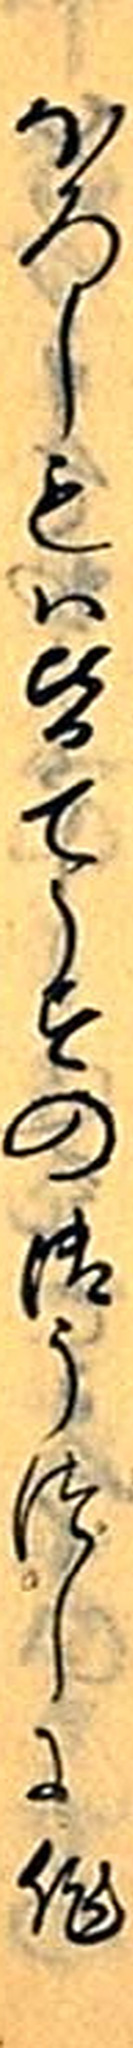ほろしもは皆てうすの御うつしに作
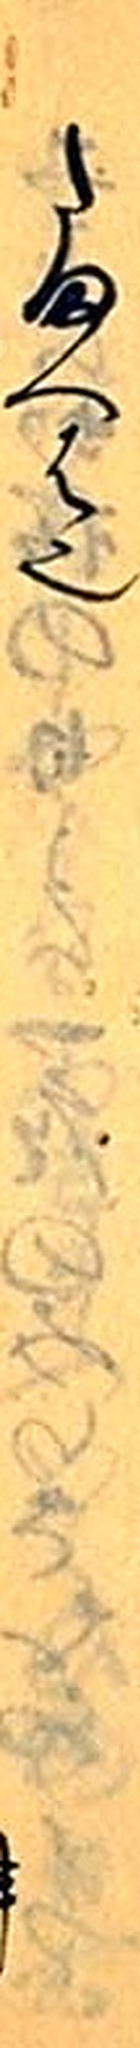たまへは也
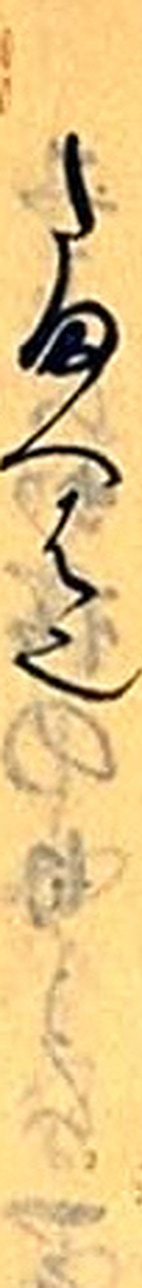たまへは也
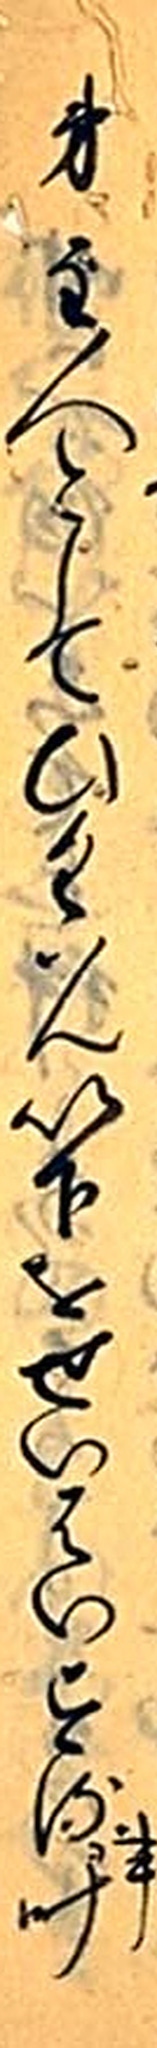弟主人としてひくはん以下をせいはいする事叶
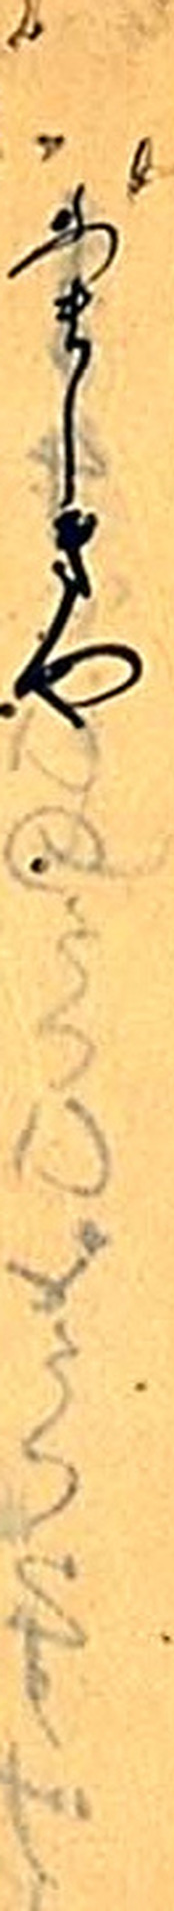ふましきや
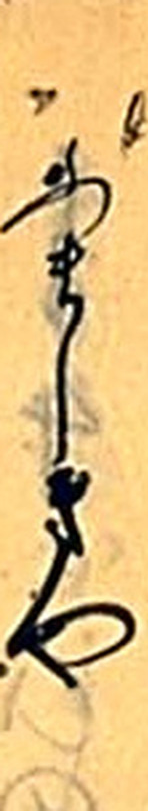ふましきや
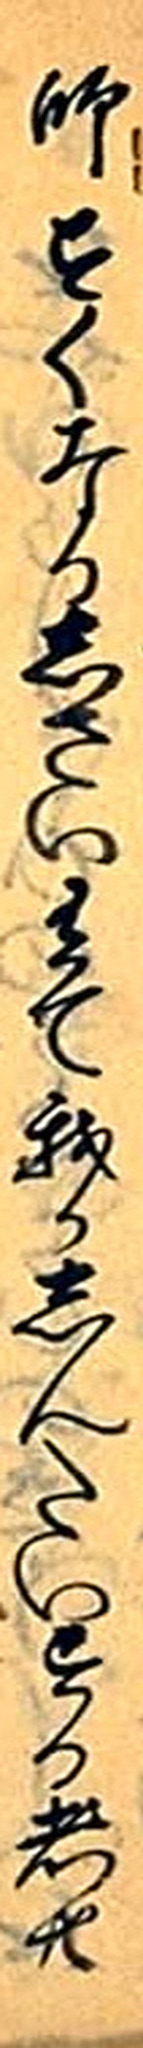師すくなるしさい有て我かしんたいする者共
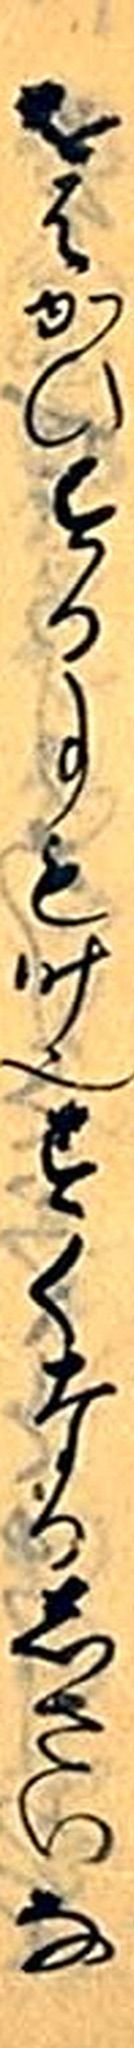をはかひする事も叶也すくなるしさいな
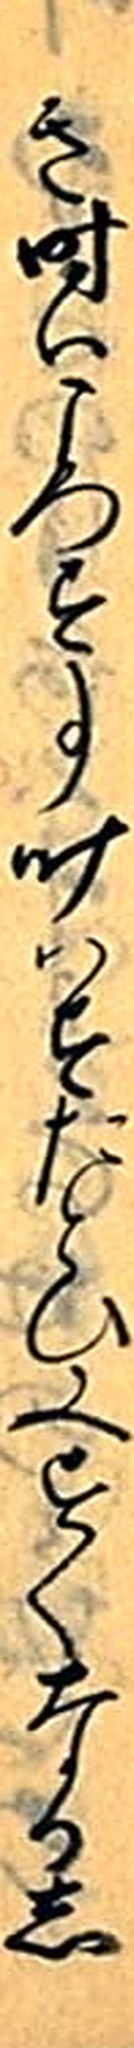き時はころす事叶はすたとひ又すくなるし
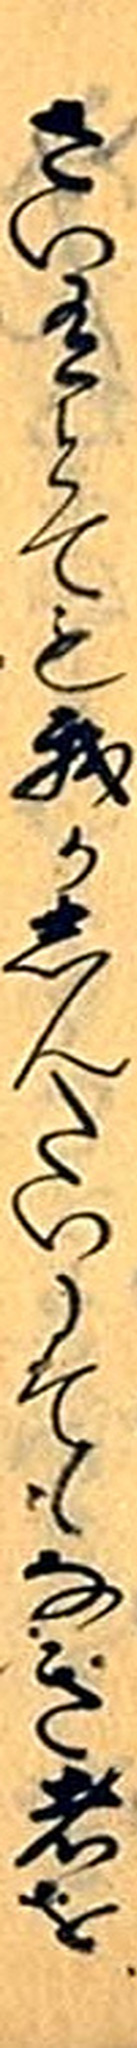さい有とても我かしんたいにてもなき者を
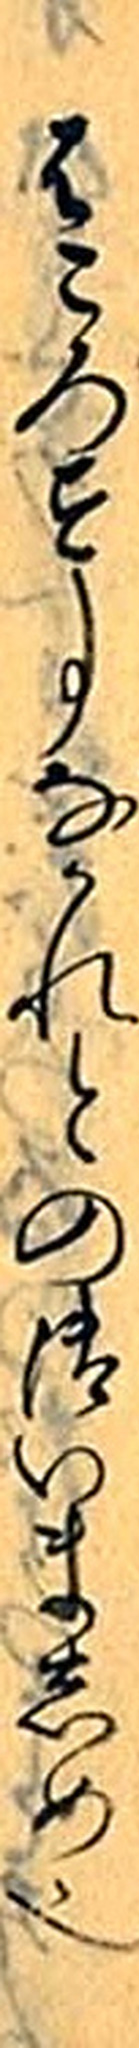はころす事なかれとの御いましめ也
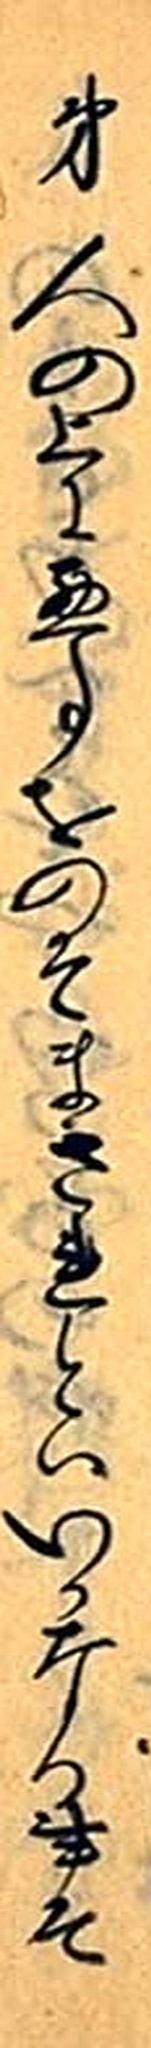弟人の上に悪事をのそまされとはいかなる事そ
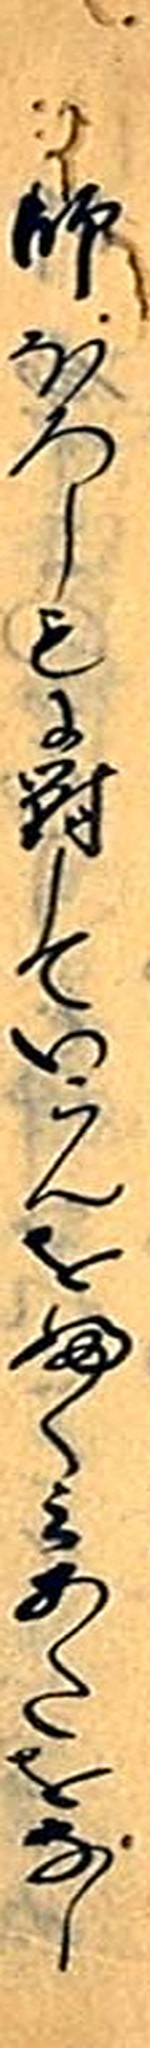師ほろしもに対していこんをふくみあたをなし
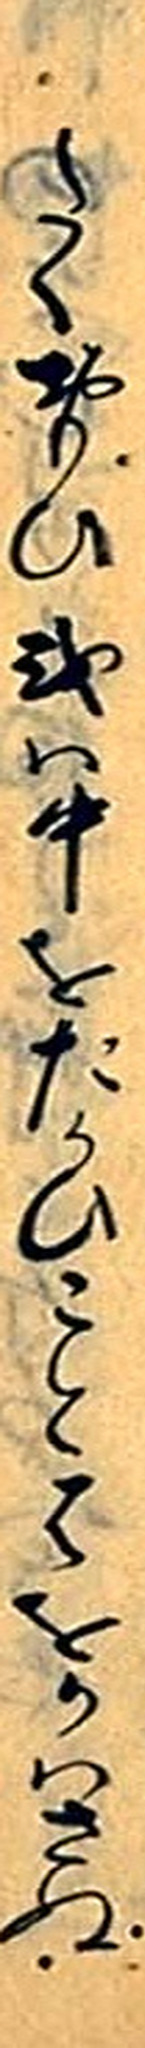たくおもひ或は中をたかひことはをかはさぬ
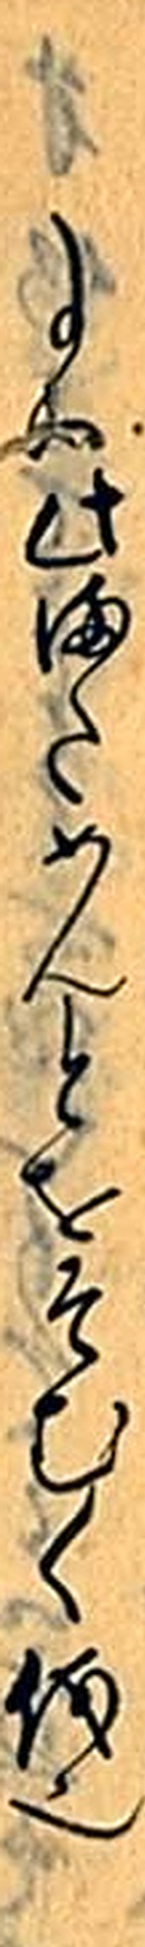事は此まためんとをそむく儀也
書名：ドチリナ・キリシタン
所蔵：東京大学総合図書館 / General Library in the University of Tokyo
